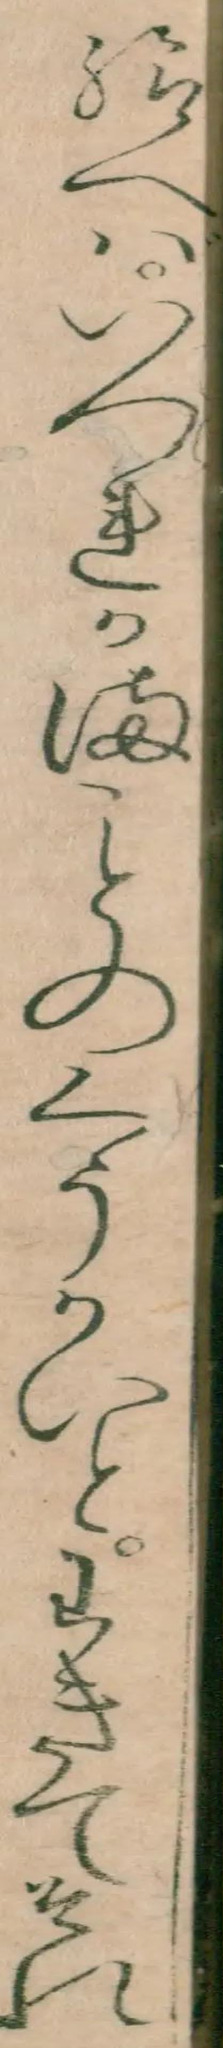給へは。いつれかまことのくうかいと。わきてそれ
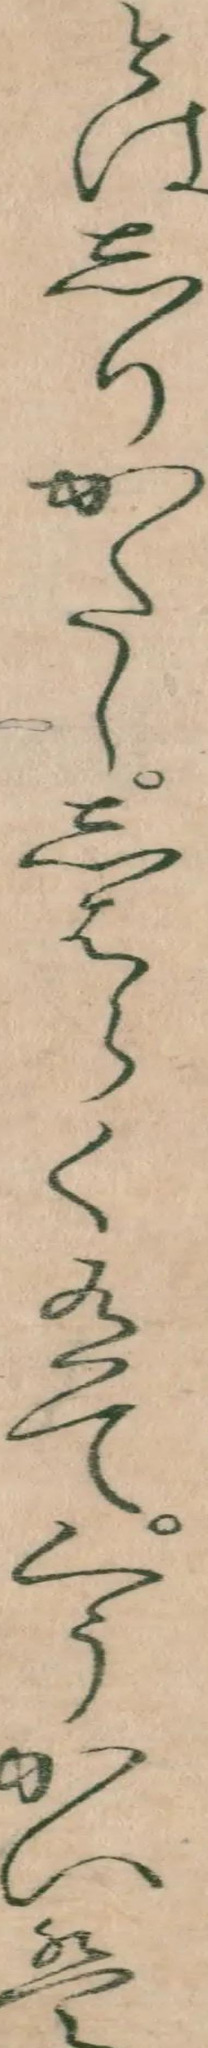とはしりがたし。しはらく有て。くうかいは
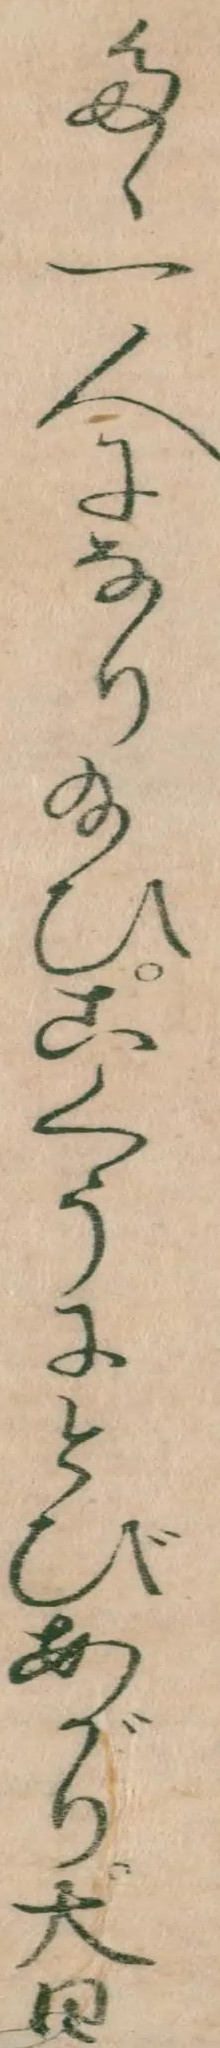たゝ一人になり給ひ。こくうにとびあがり。大日
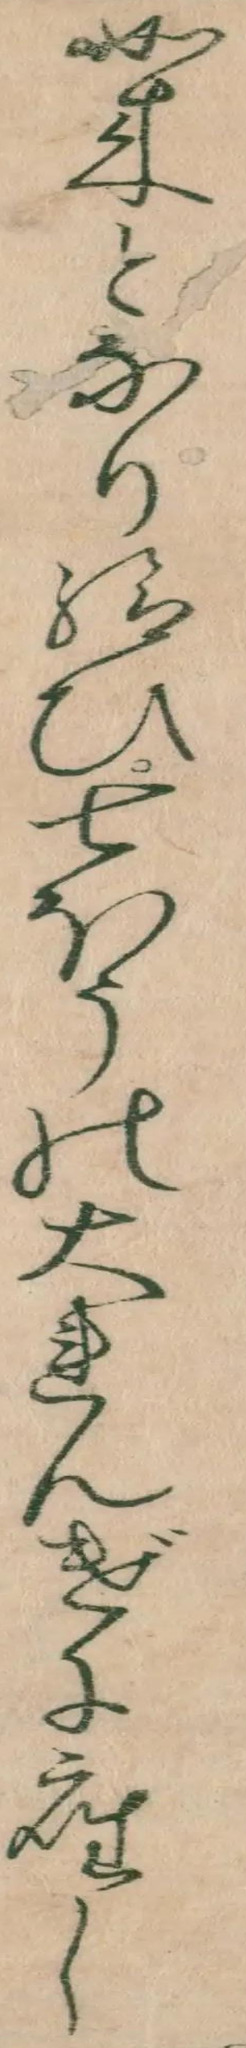如来となり給ひ。七ほうの大れんげに座し
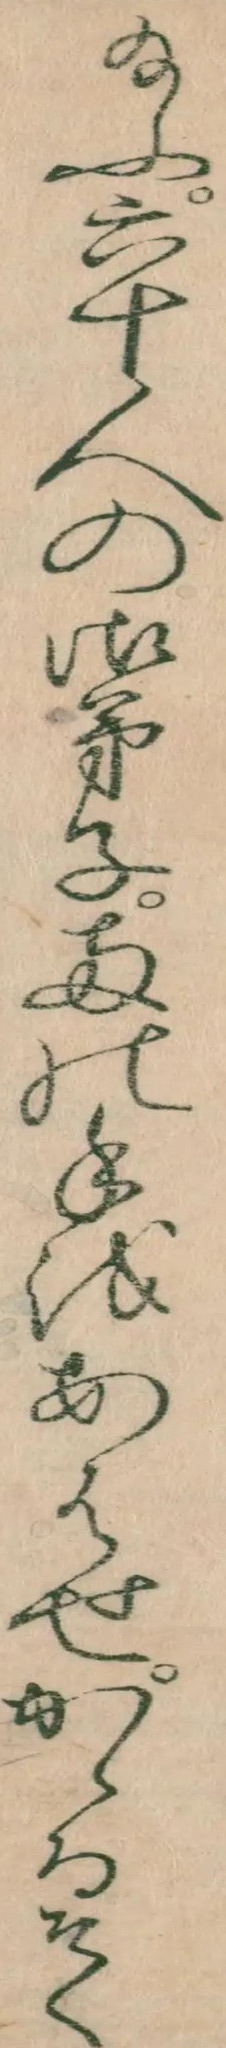給ふ。六十人の御弟子。両の手をあはせ。かゝるそく
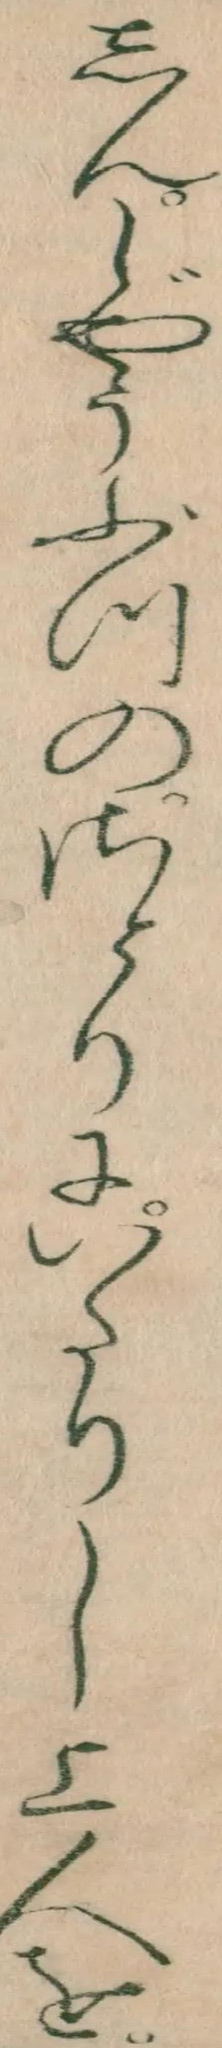しん。じやうぶつの。さとりに。いたりし上人を。
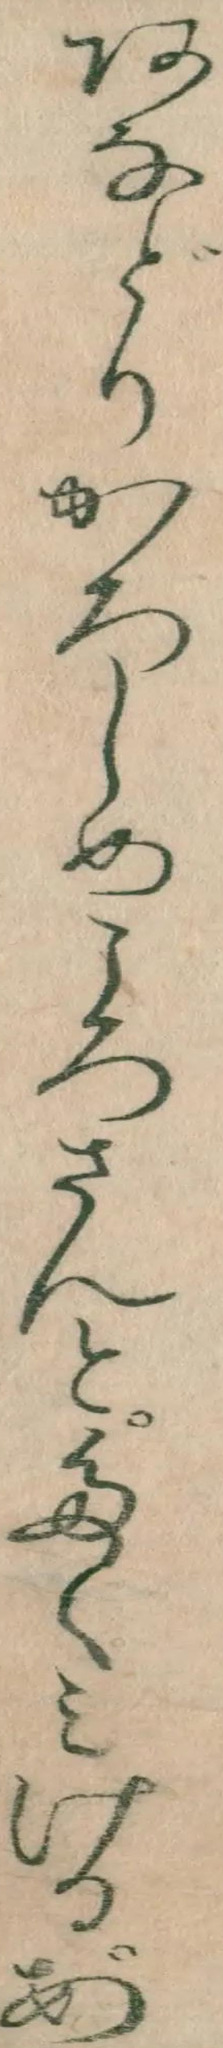あなどりかろしめころさんと。たくみける。あ
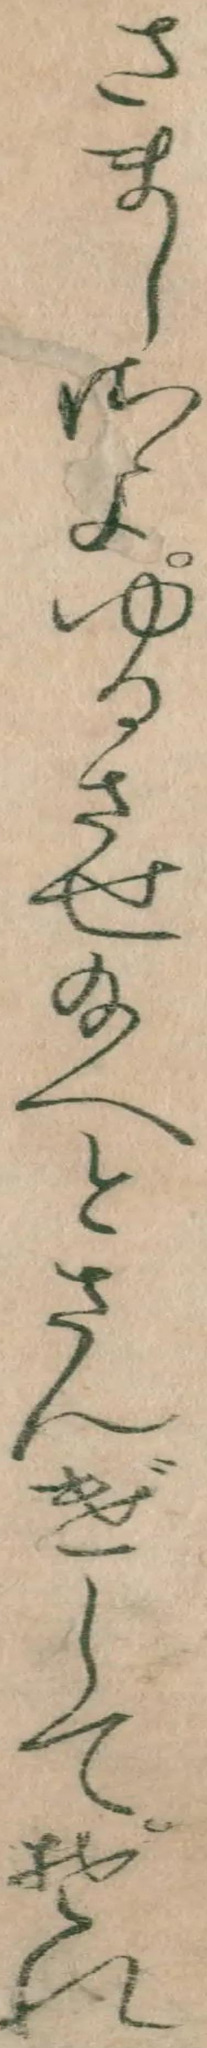さましさよ。ゆるさせ給へとさんげして。それ
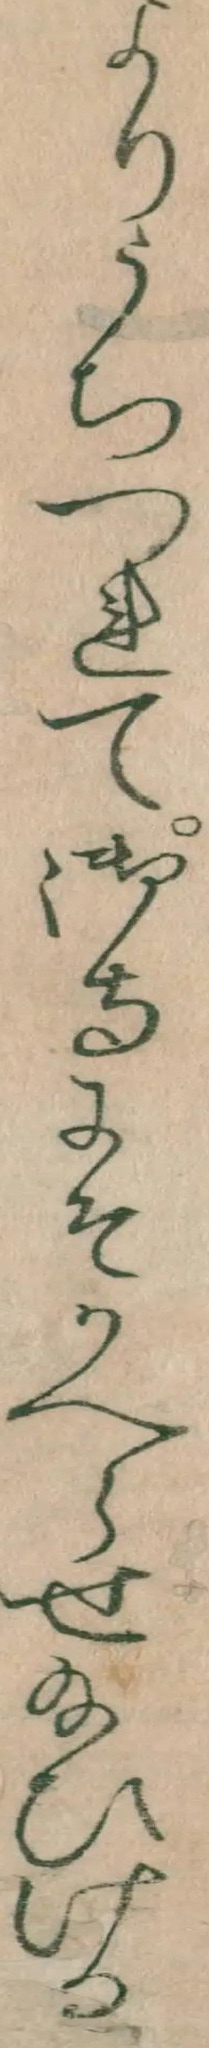よりうちつれて。御寺にそかへらせ給ひける

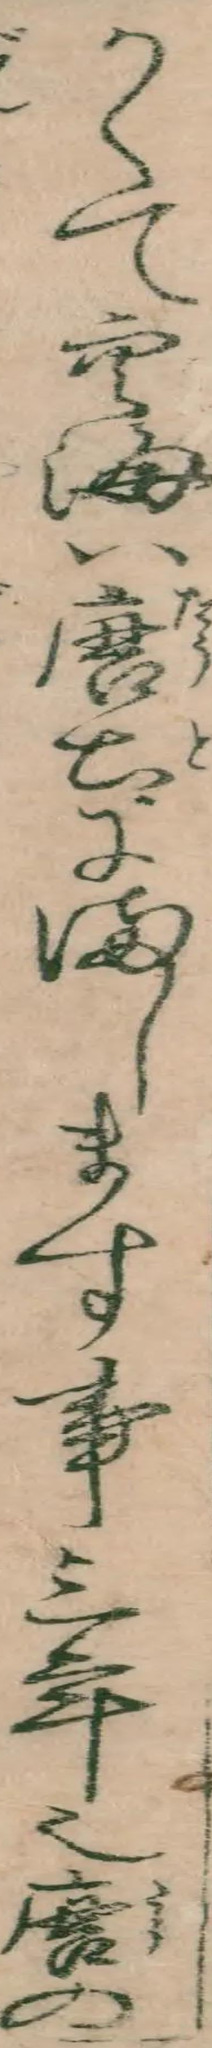かくて空海は唐土にまします事三年也唐の
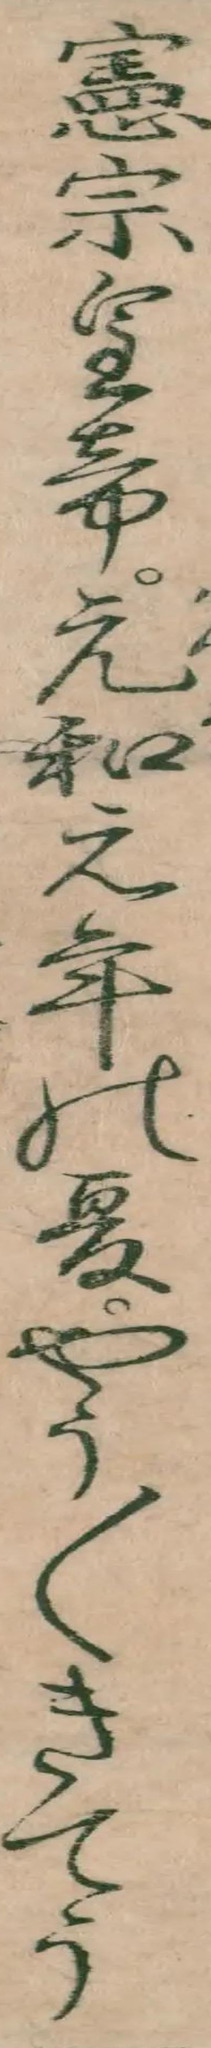憲宗皇帝。元和元年の夏。やう〳〵きてう
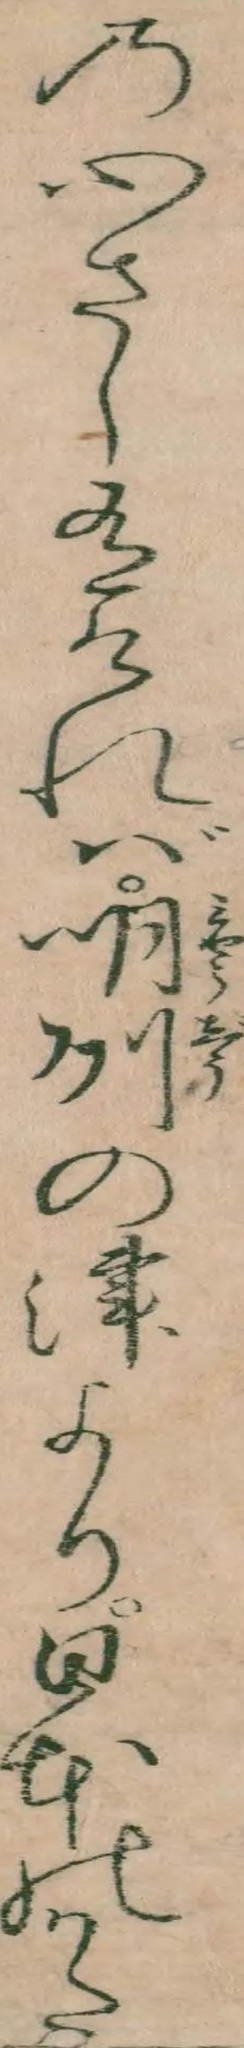の心さし有ければ。明州の津より。日本のかた
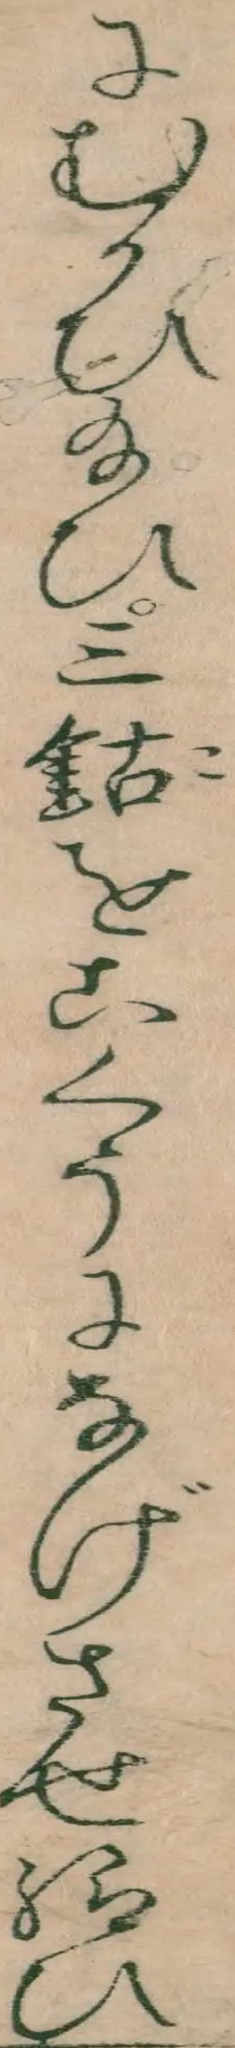にむかひ給ひ。三鈷をこくうになげさせ給ひ
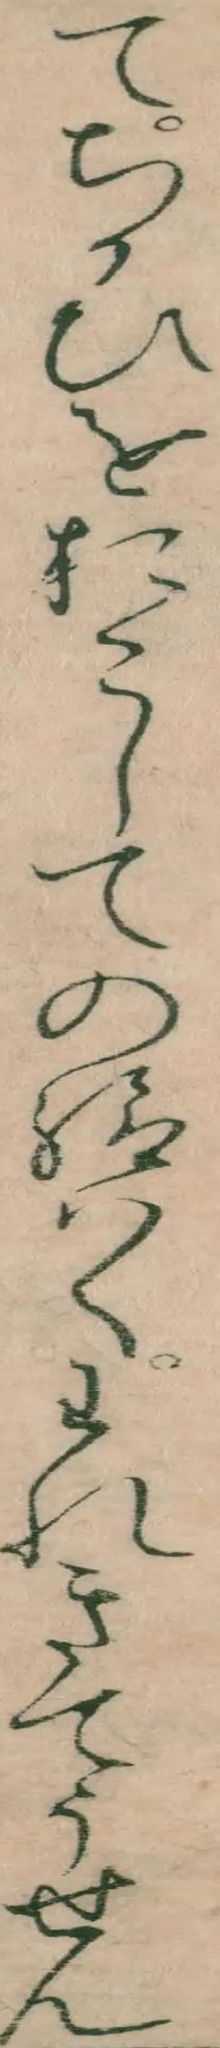て。ちかひをおこしての給はく。われきてうせん
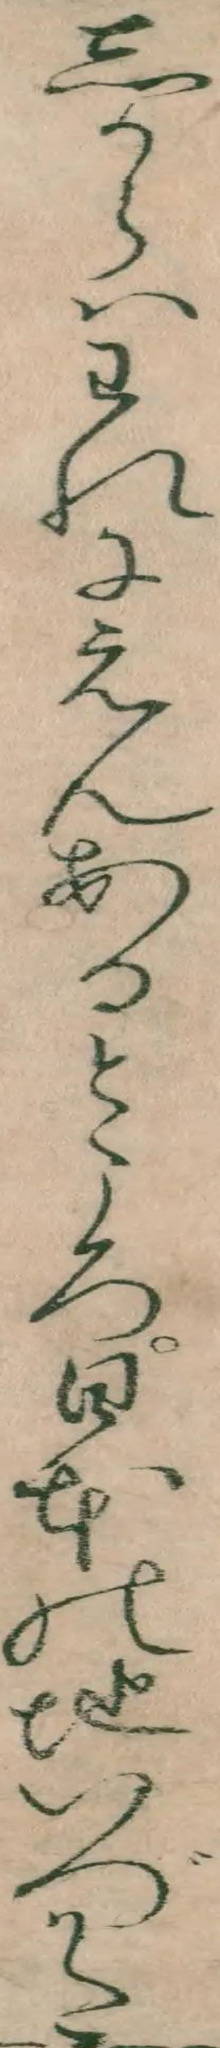しからはわれにえんあるところ。日本の地いづかた
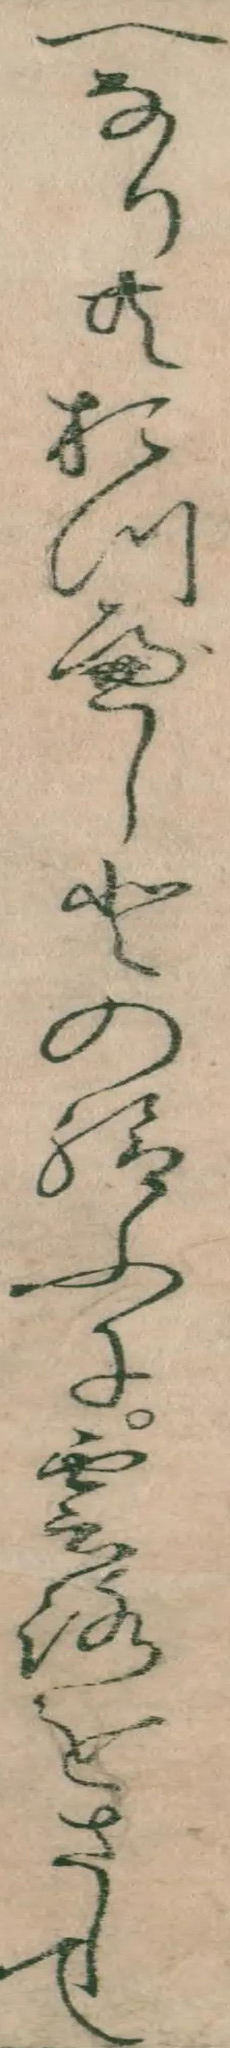へなり共おつべしとの給ふに。雲路をさして
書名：弘法大師御本地 3巻. [1]
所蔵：国立国会図書館 National Diet Library, JAPAN
